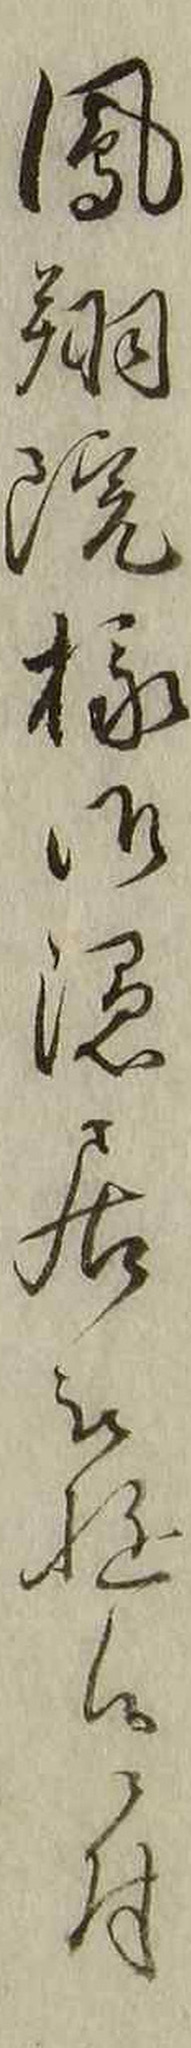鳳翔院様御隠居被遊候ニ付
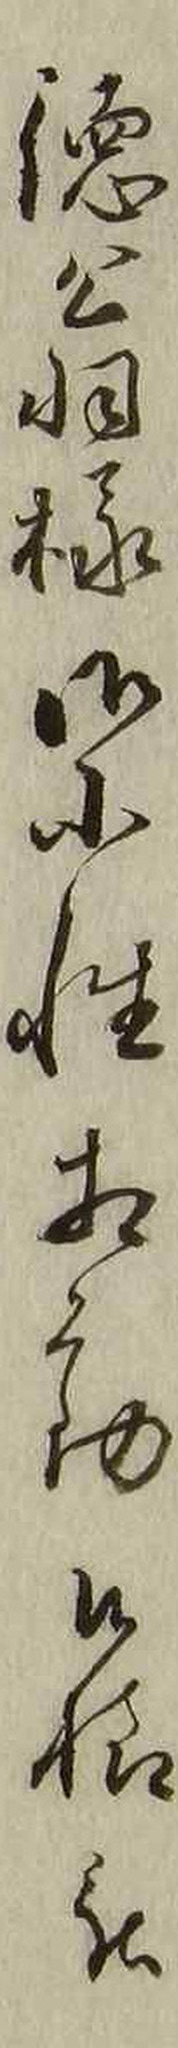徳翁様御小性相勤候様被
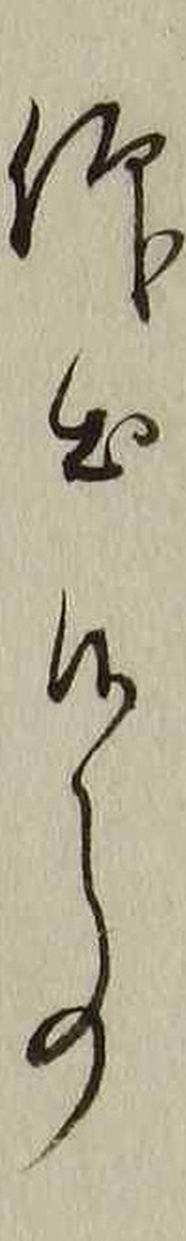仰出候事
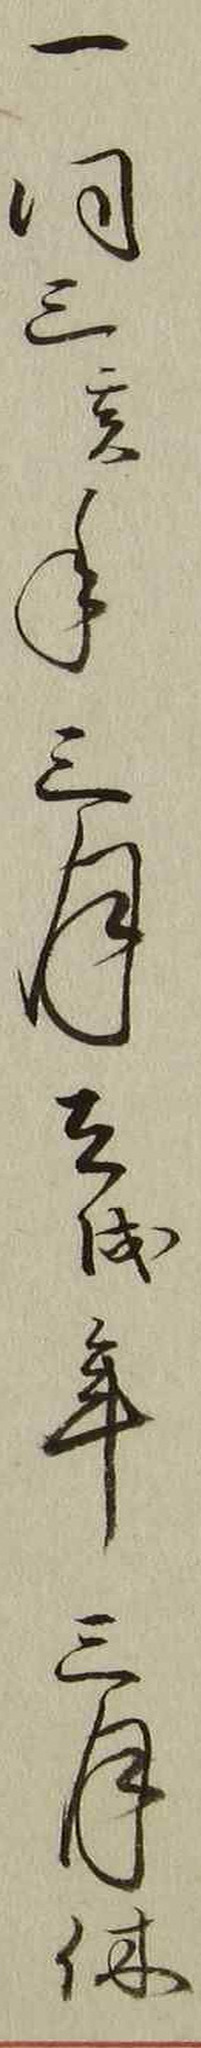一同三亥年三月去戌年三月休
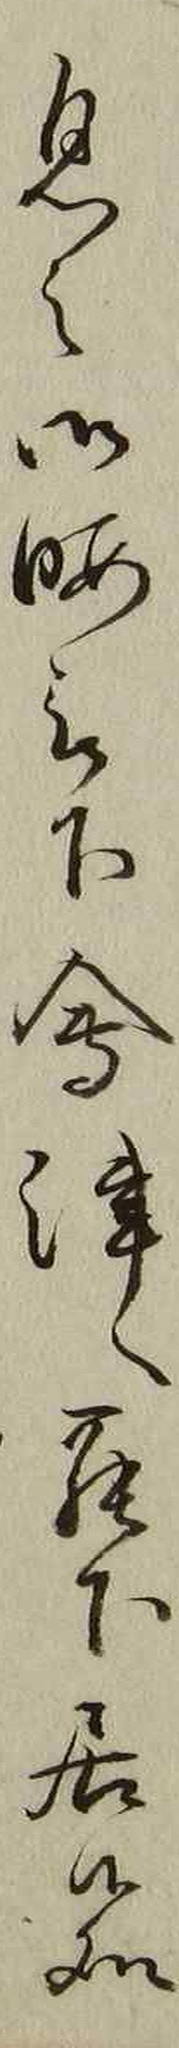息之御暇被下会津へ罷下居候処
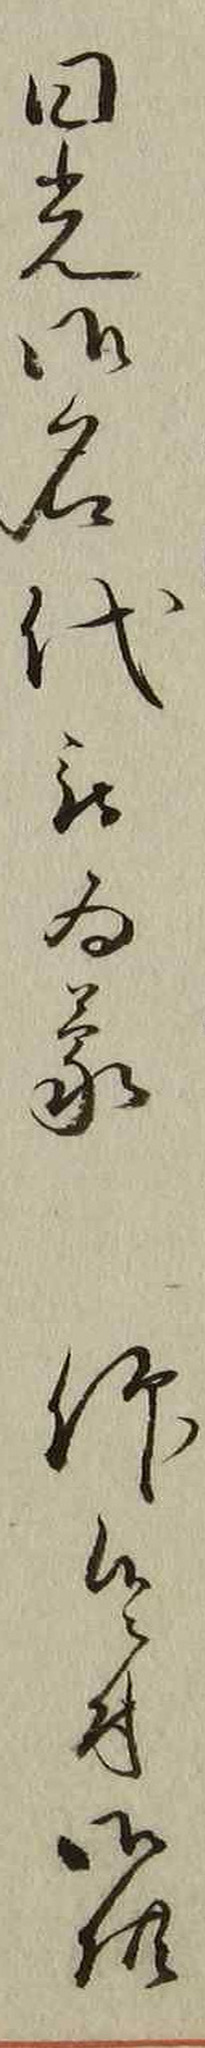日光御名代被為蒙仰候ニ付御供
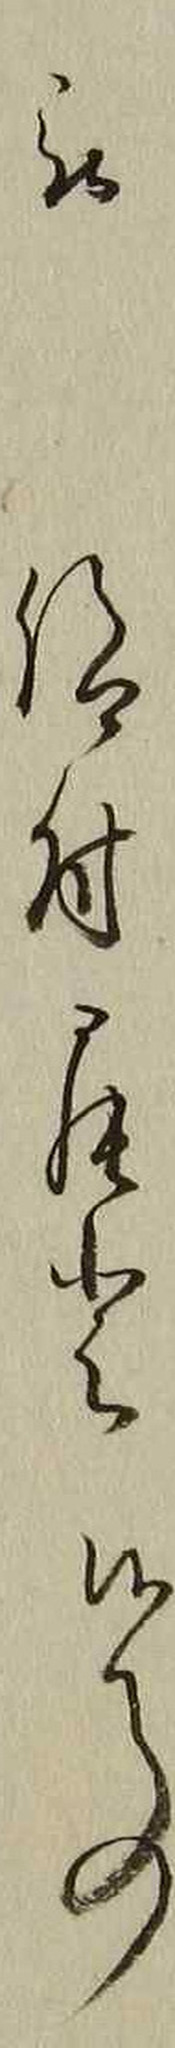被仰付罷登候事
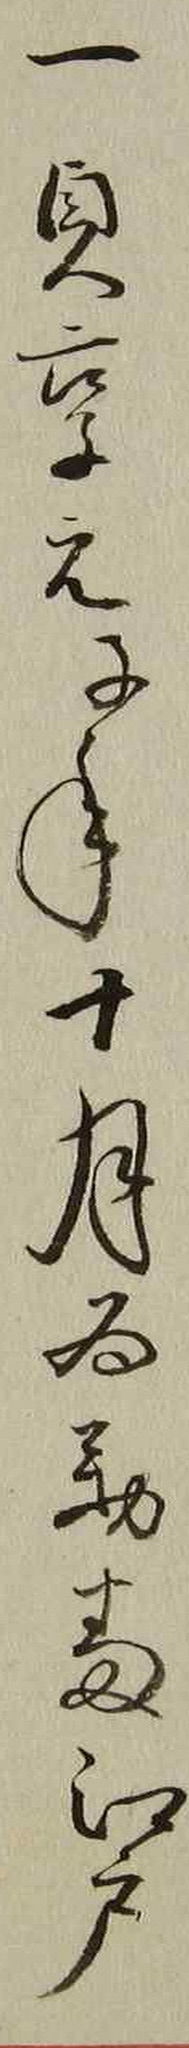一貞享元子年十月為勤番江戸
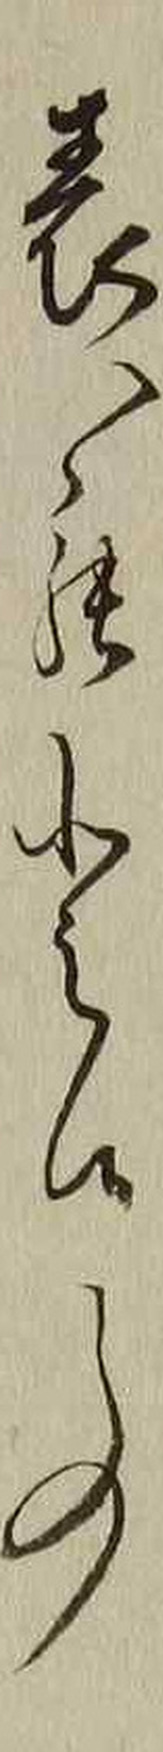表へ罷登候事
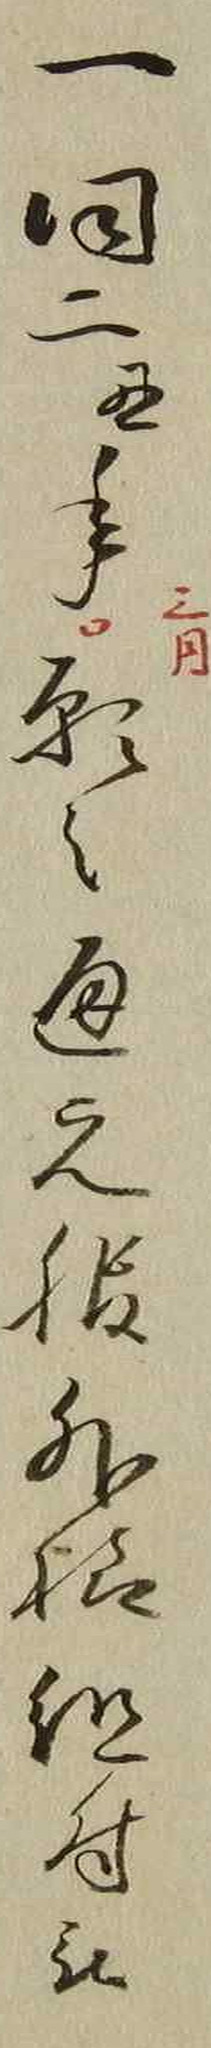一同二丑年◦三月願之通元服外様組付被
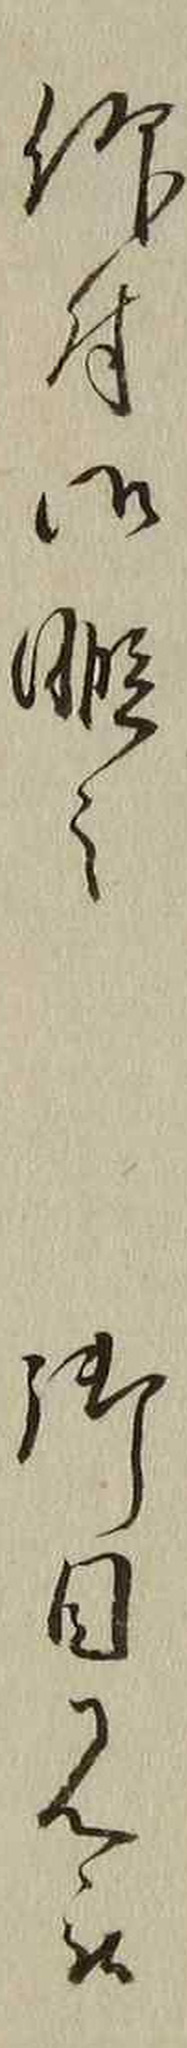仰付御暇之御目見被
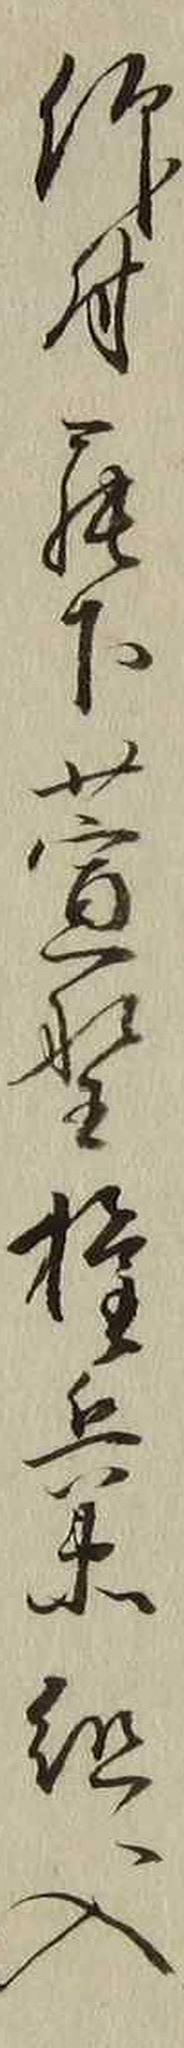仰付罷下萱野権兵衛組へ入
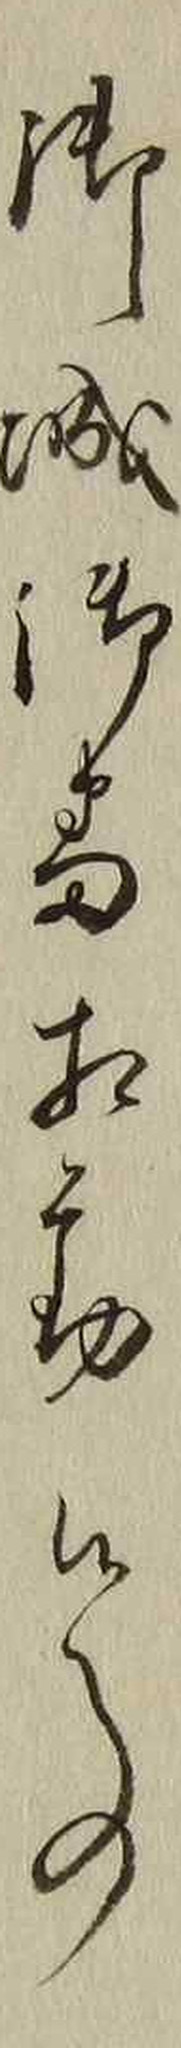御城御番相勤候事
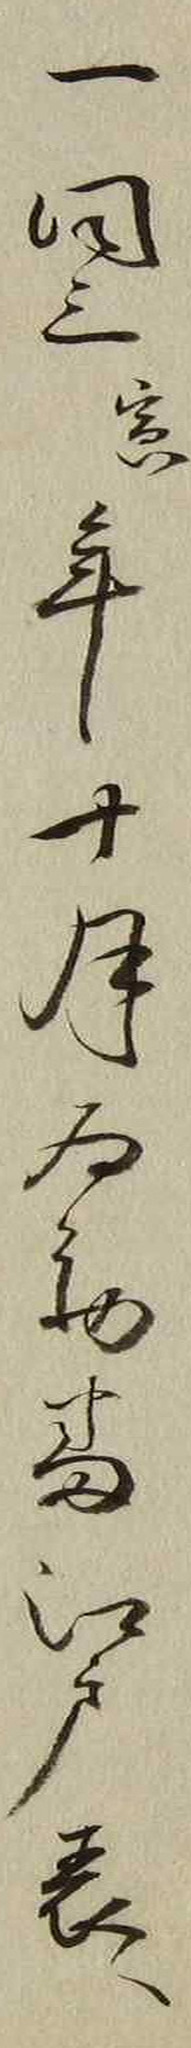一同三寅年十月為勤番江戸表へ
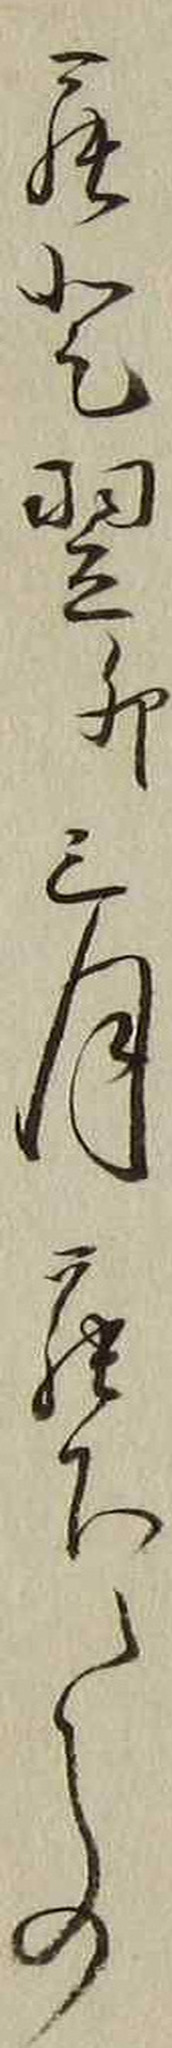罷登翌卯三月罷下候事
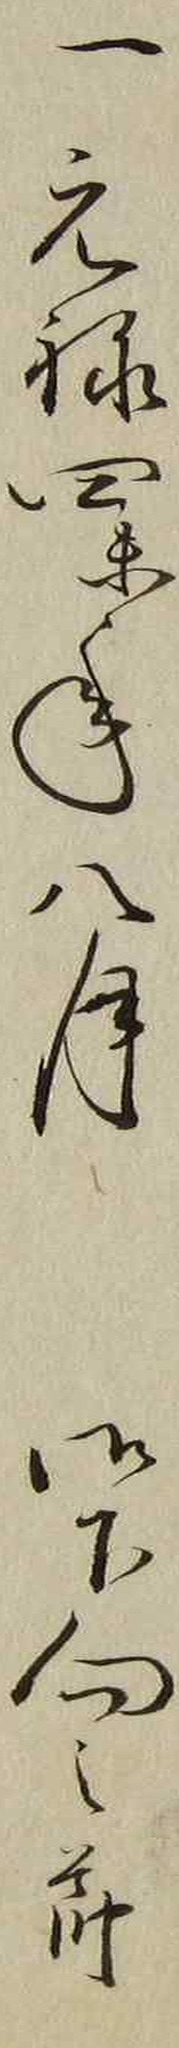一元禄四未年八月御下向之節
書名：諸士系譜　巻之2　い之部2
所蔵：会津若松市立会津図書館
